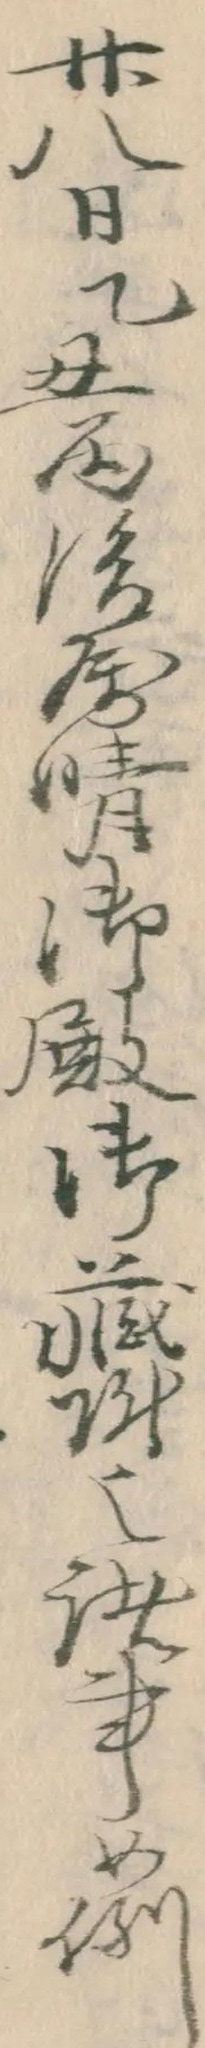廿八日乙丑雨後属晴御殿御蔵附之諸事如例
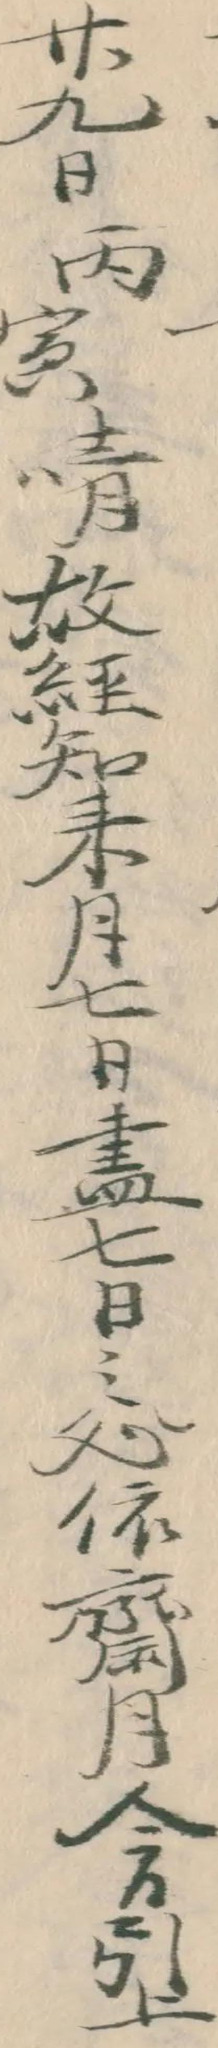廿九日丙寅晴故経知来月七日昼七日之処依斎月今日引上
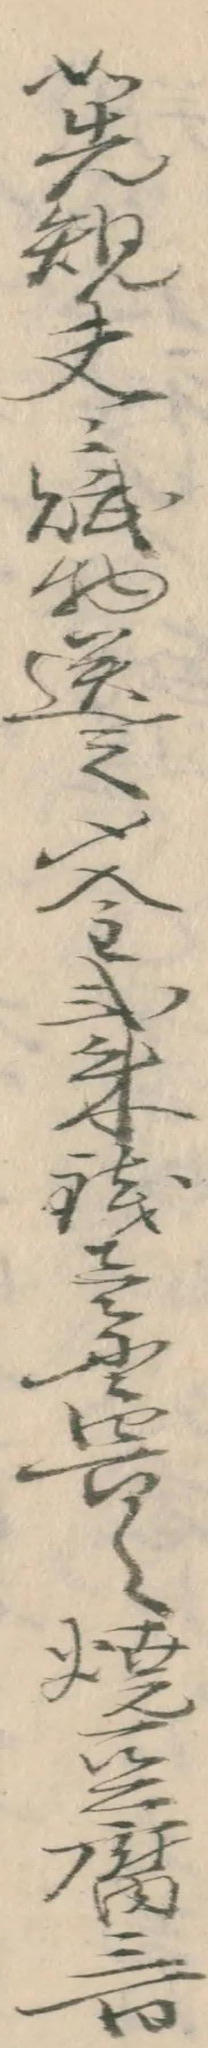如先規夫々賦物送之〆金弐朱銭壱貫四百文焼豆腐三百
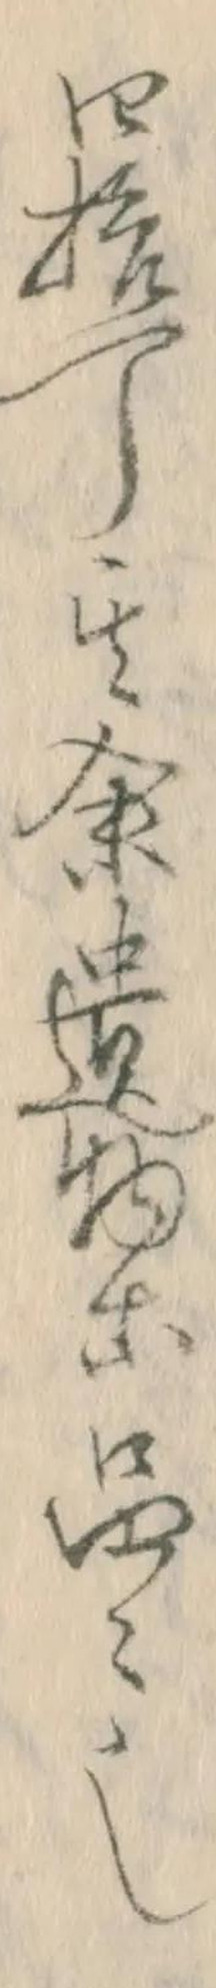四拾丁其余遺物等品々也
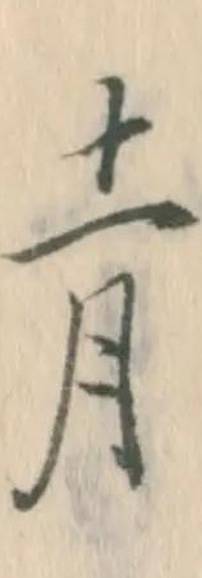十一月
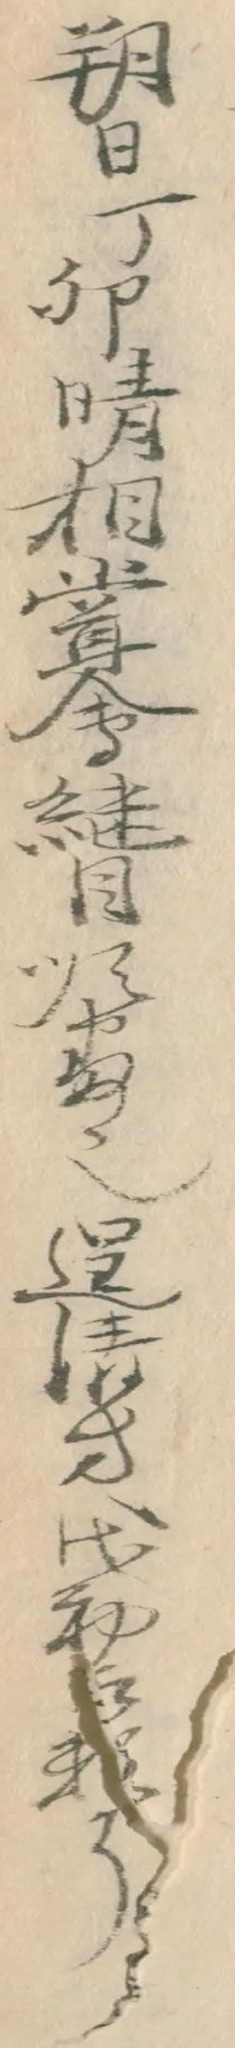朔日丁卯晴相嘗会継目順番也逞清方へ代勤相頼了

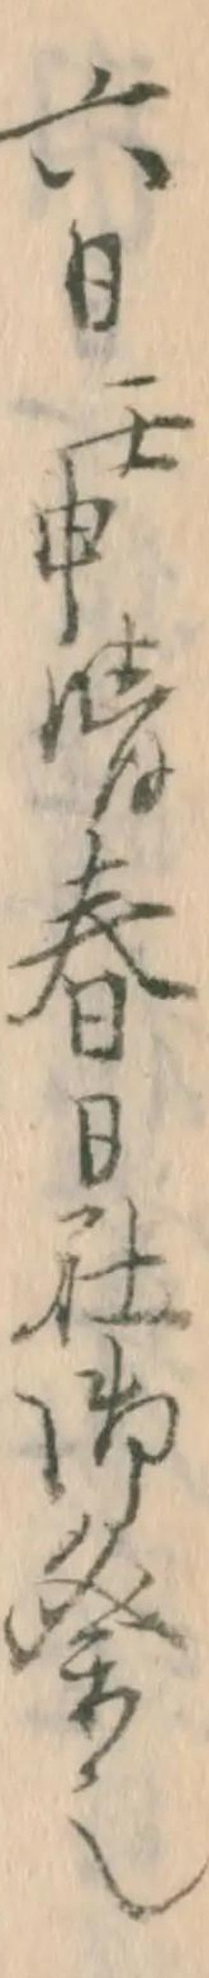六日壬申晴春日社御祭也
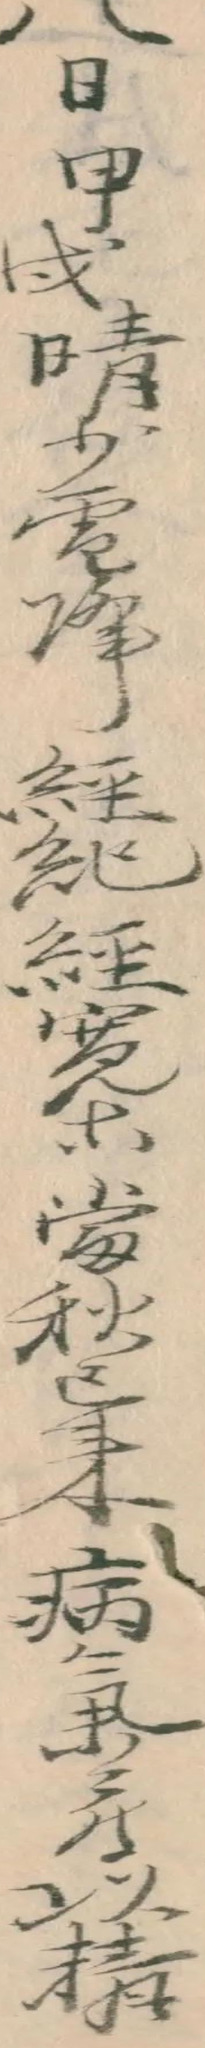八日甲戌晴少雹降経紀経寛等當秋已来病氣ニ付以精
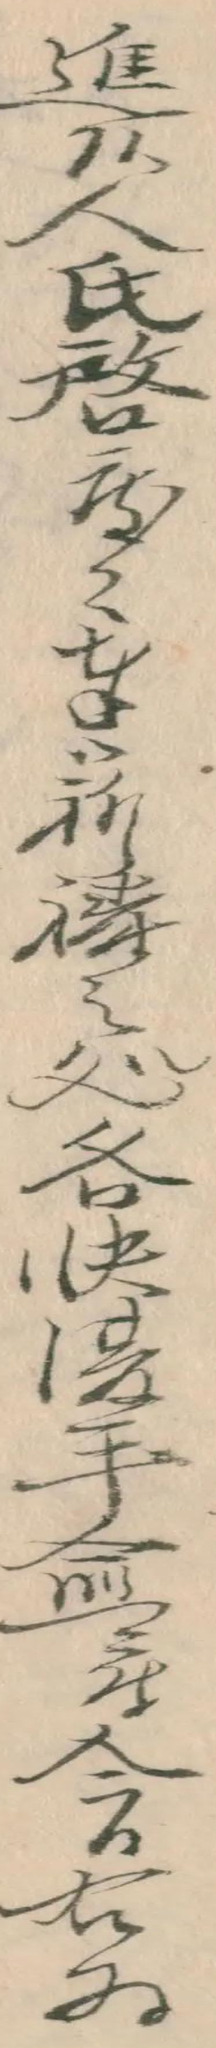進頭人氏啓度々奉御祈祷之処各快復平愈ニ付今日右為
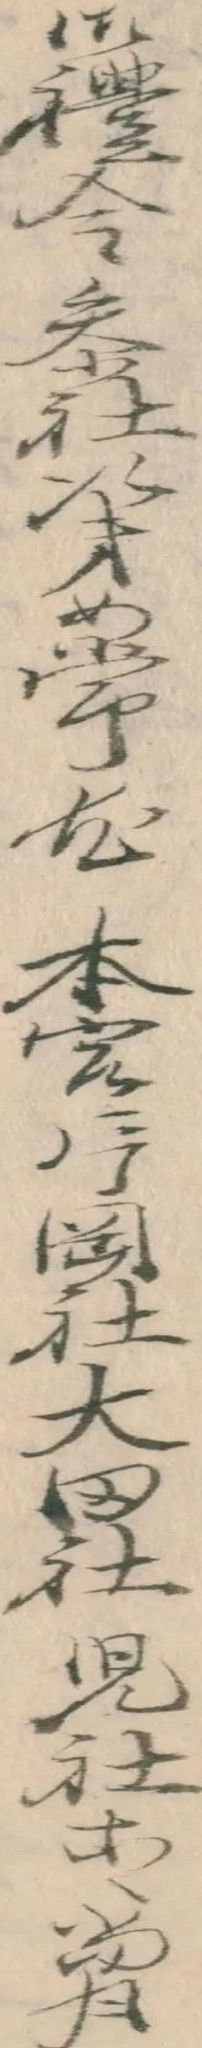御禮令参社次第如常尤本宮片岡社大田社児社等へ當月
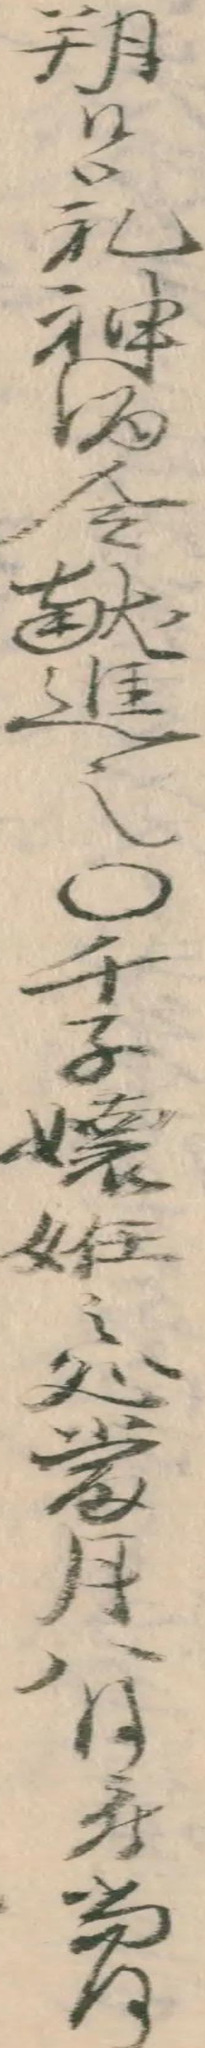朔日御礼神酒令献進也○千子懐妊之処當月八月付當月
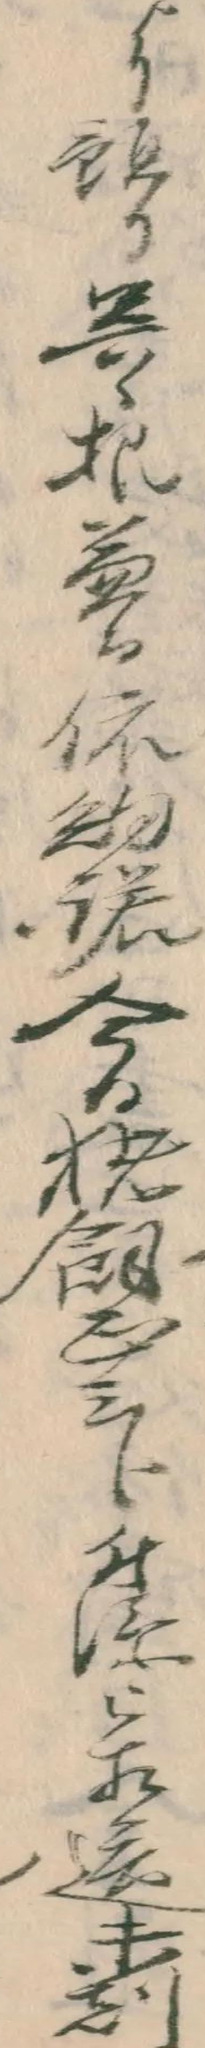より預り呉候様兼而依約諾今日猪飼正三郎付添被相違未刻
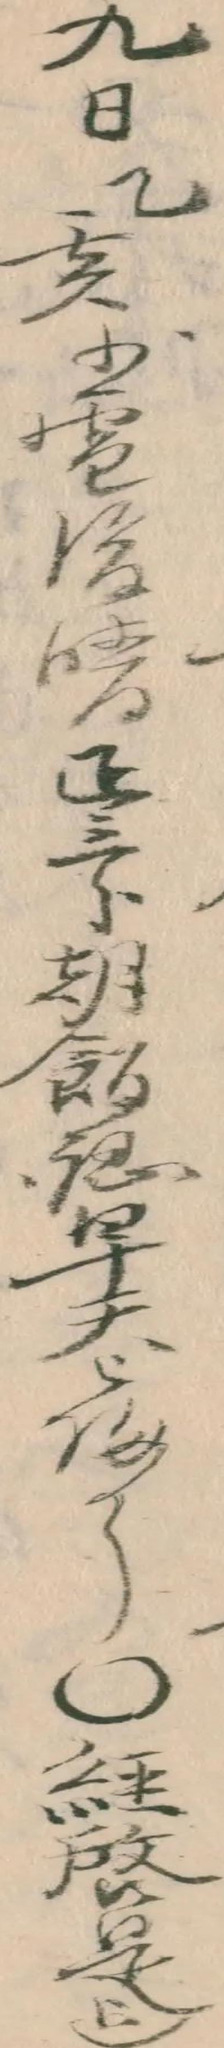九日乙亥少雹後晴正三郎朝飯認早天被帰了○経啓是迄
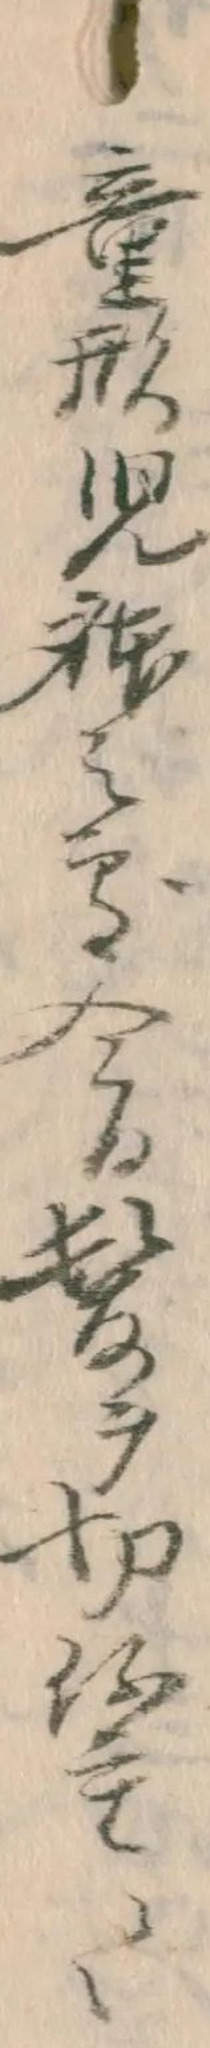童形児躰之處今日髪ヲ切珍重々々
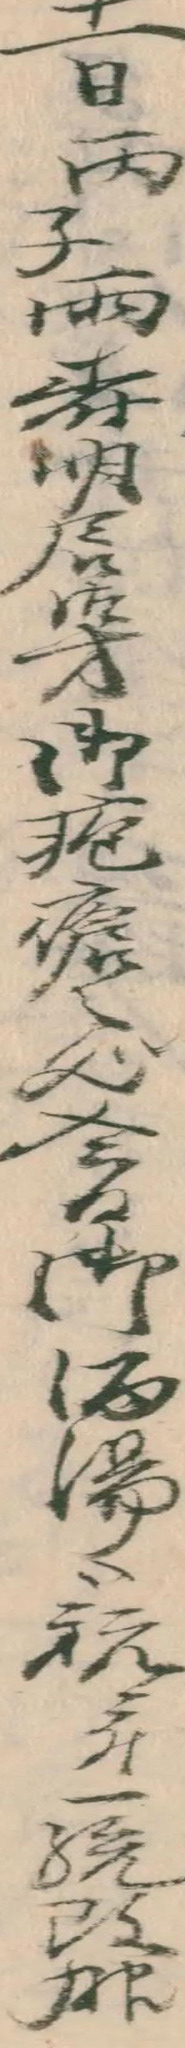十一日丙子明居御方御疱瘡之処今日御酒湯御祝ニ付一統改服
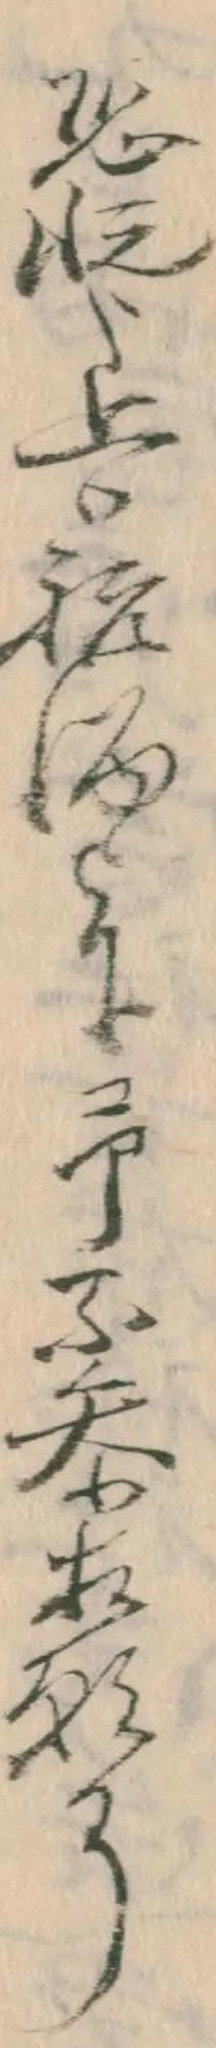恐悦之上御祝酒被下予不参相願了
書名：賀茂社記録. 第66冊
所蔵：国立国会図書館 National Diet Library, JAPAN
